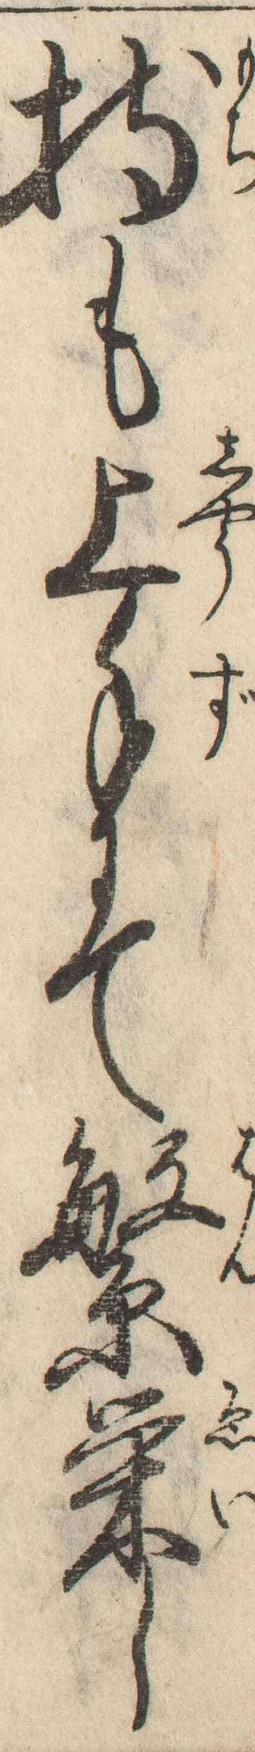持も上手にて繁栄し
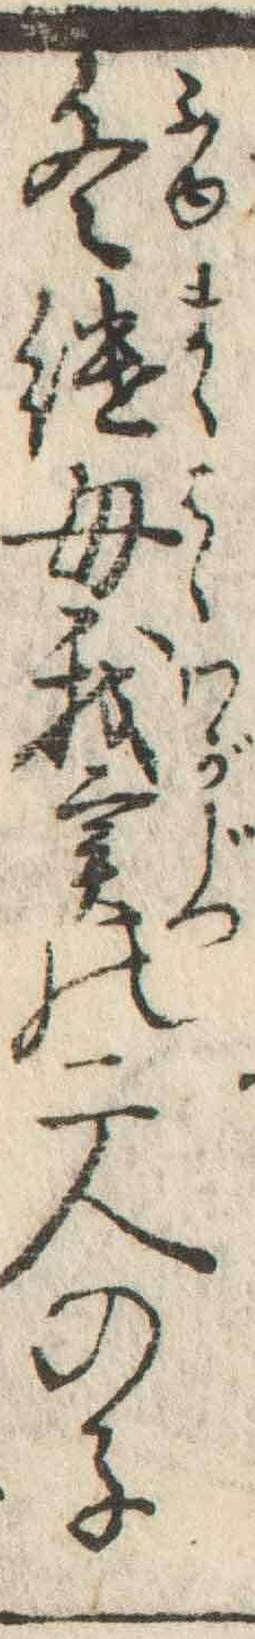冬継母我実の二人の子
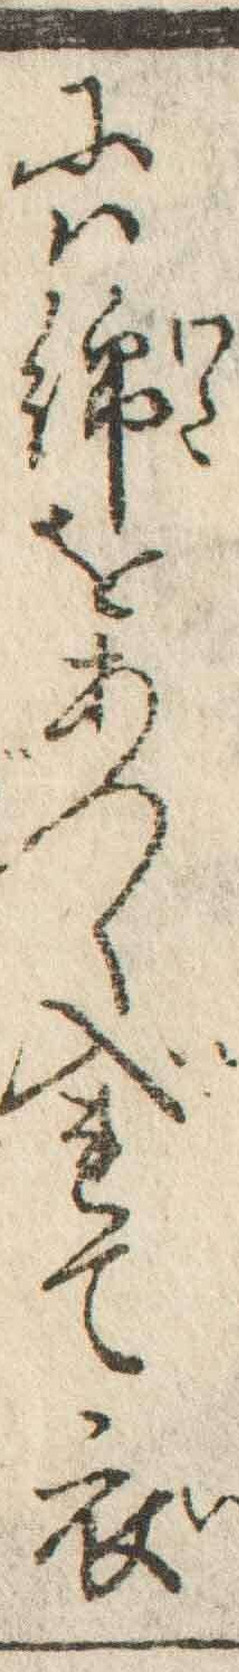には綿をあつく入れて衣
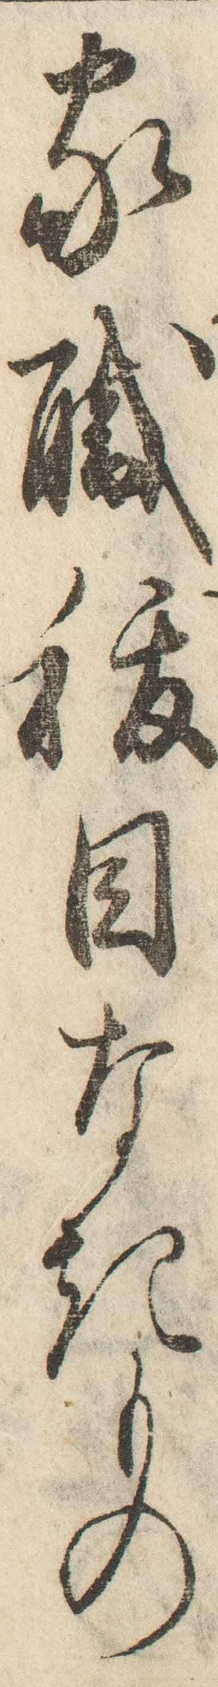家職抜目なきもの
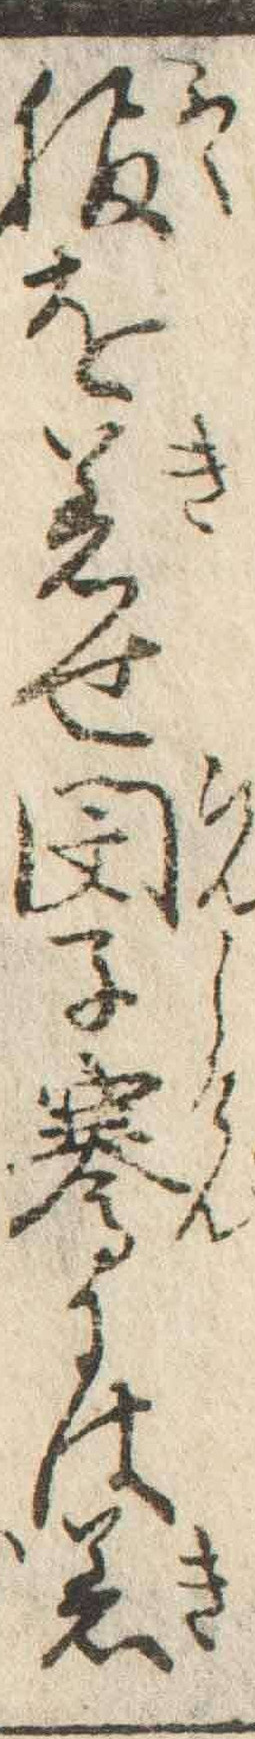服を着せ閔子騫には着
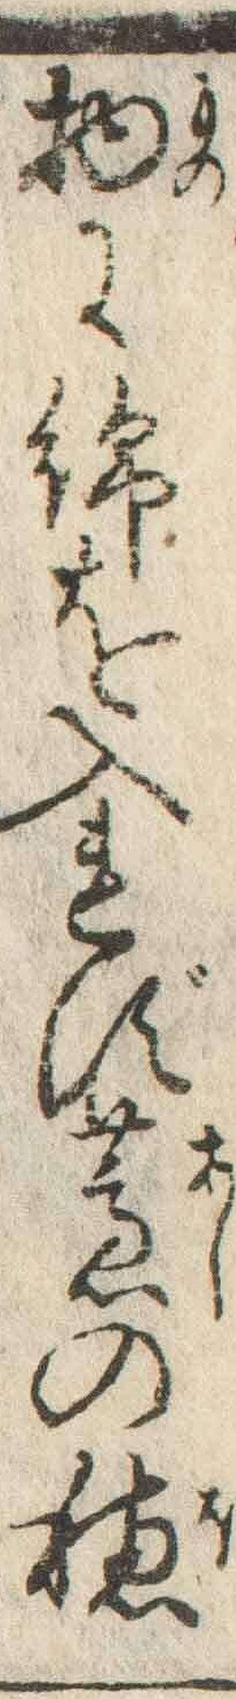物に綿を入れず蘆の穂
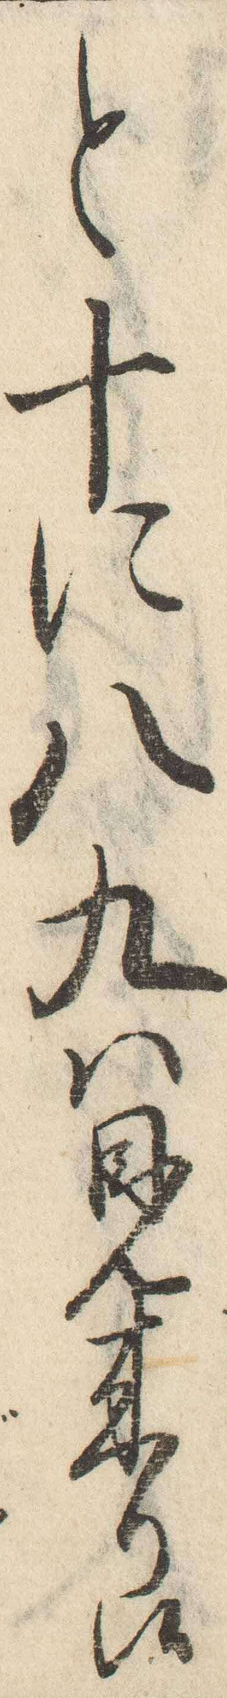と十に八九は見来り候
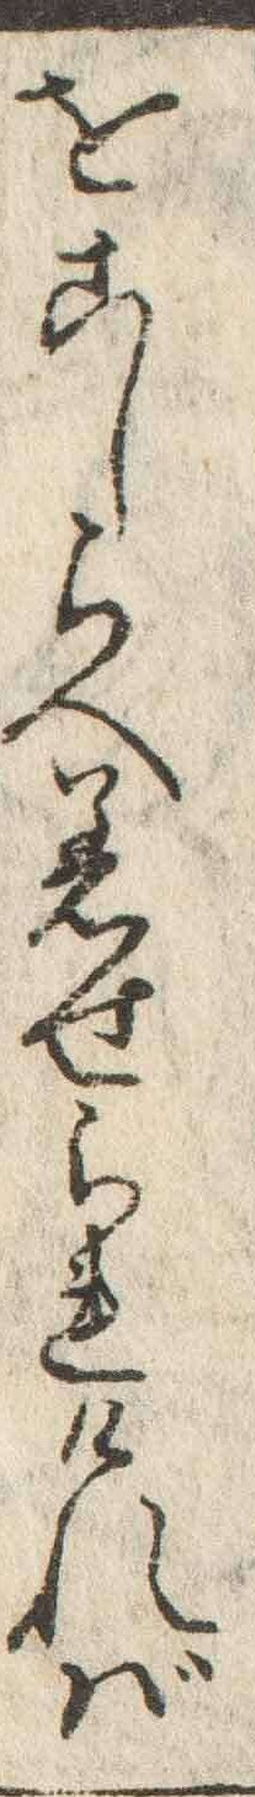をこしらへ着せられければ
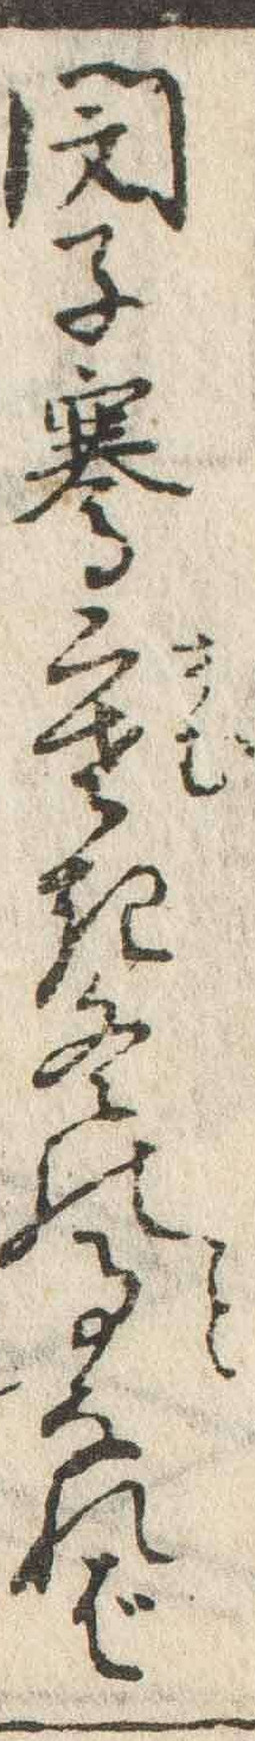閔子騫寒き冬の事なれば
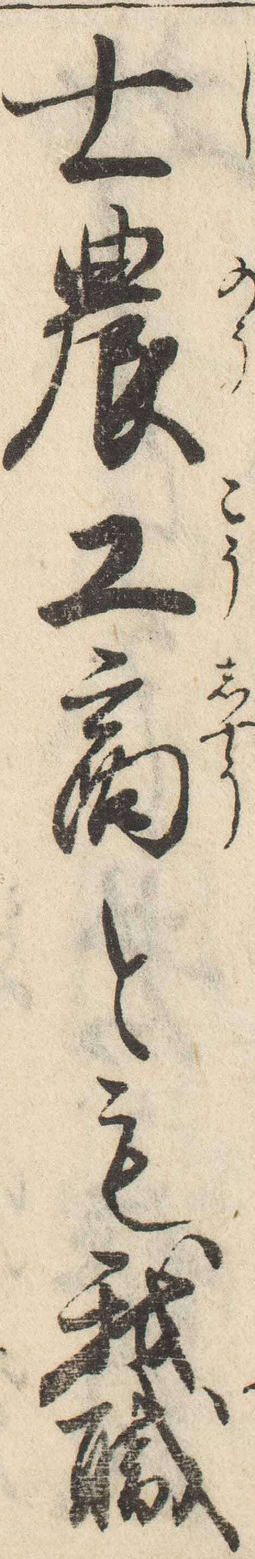士農工商とも我職
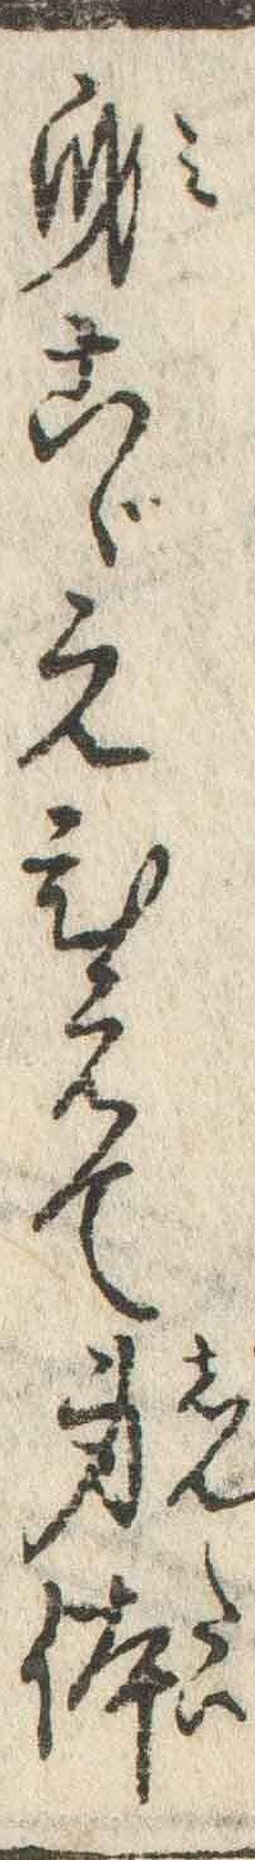身こゞえひえて身体
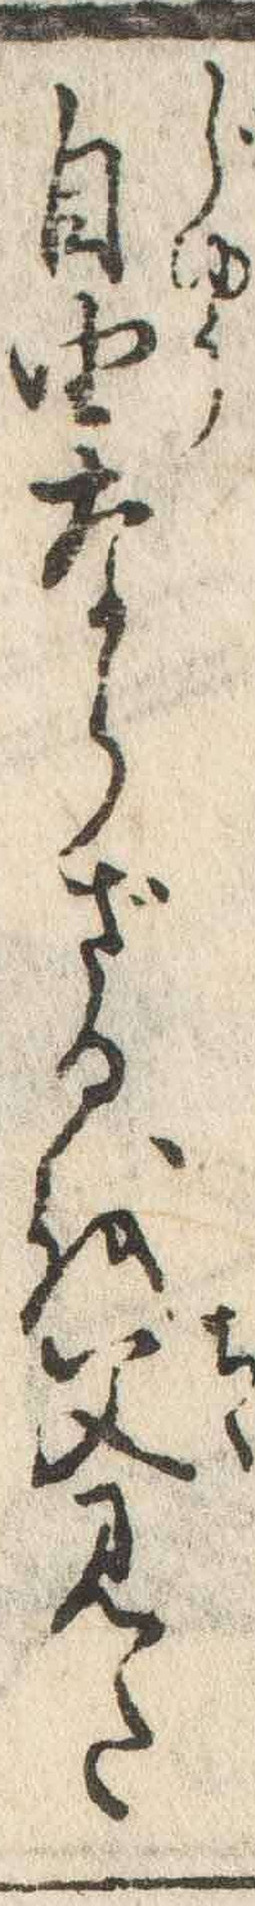自由ならざるを父見た
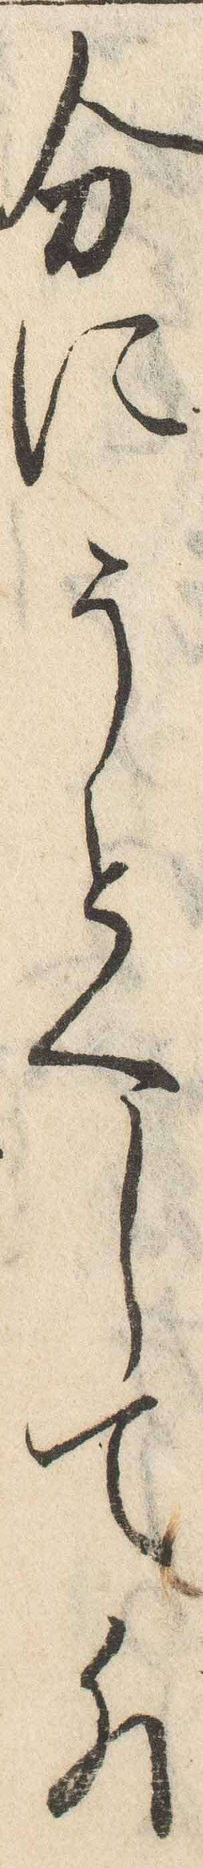分にうとくして外
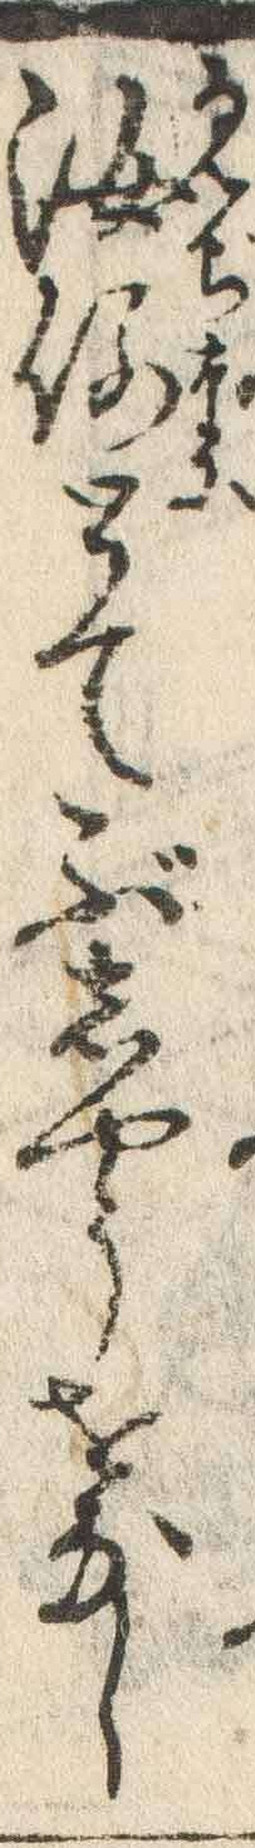汝何とてぶしやうをなし
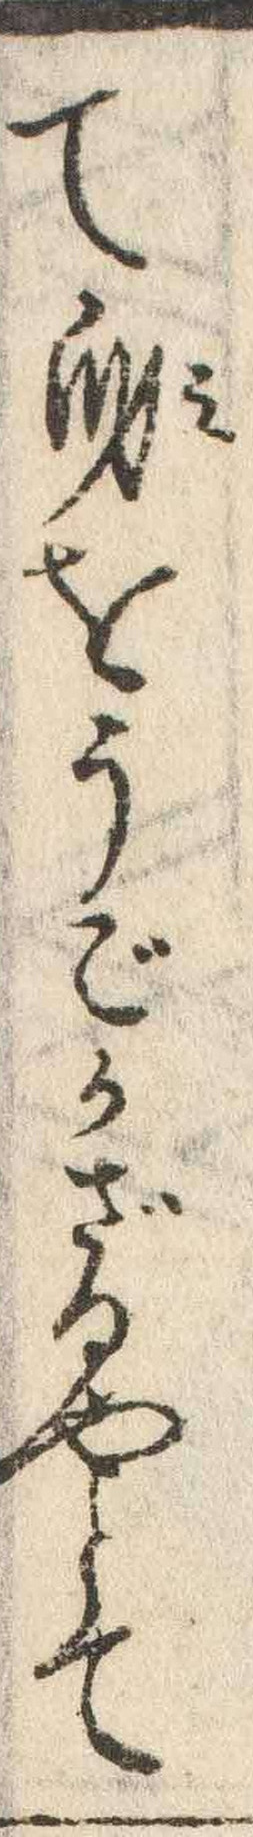て身をうごかざるやとて
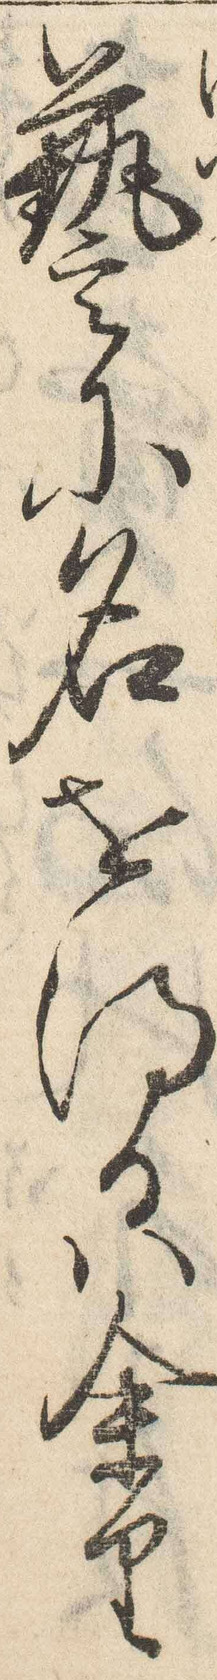芸に名を得るは余り
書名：撫育草
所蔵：東京学芸大学附属図書館 国文学研究資料館
